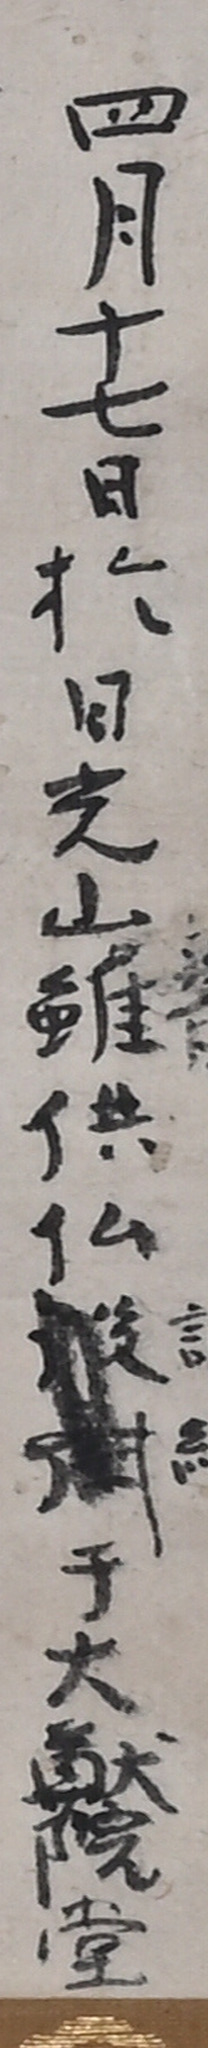四月十七日於日光山雖供仏誦経于大猷院堂
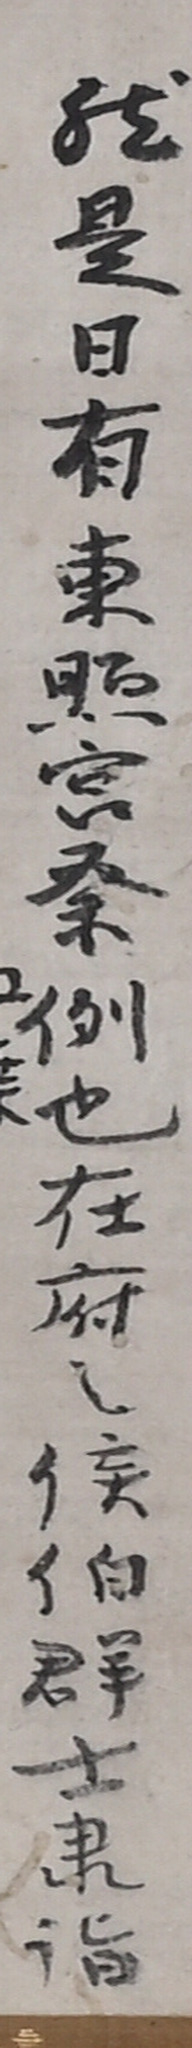然是日有東照宮祭例也在府之侯伯群士参詣
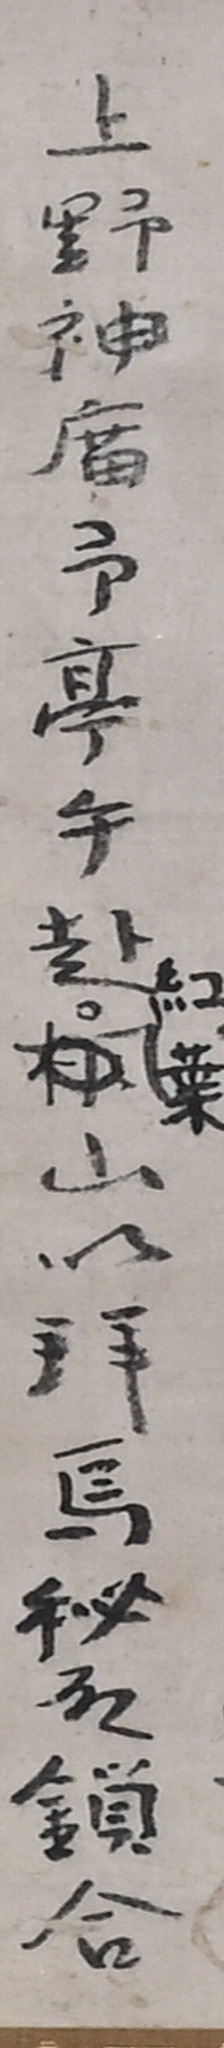上野神廟予亭午赴紅葉山以拝焉秘殿鎖合
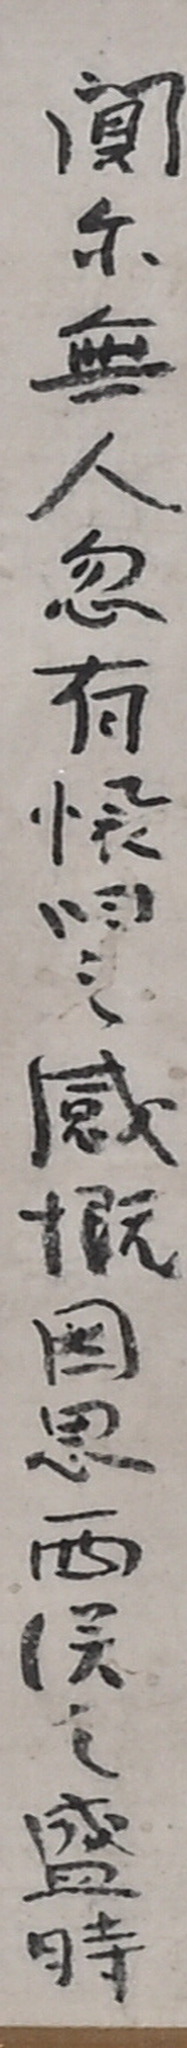閴尓無人忽有懐旧之感慨因思西院之盛時
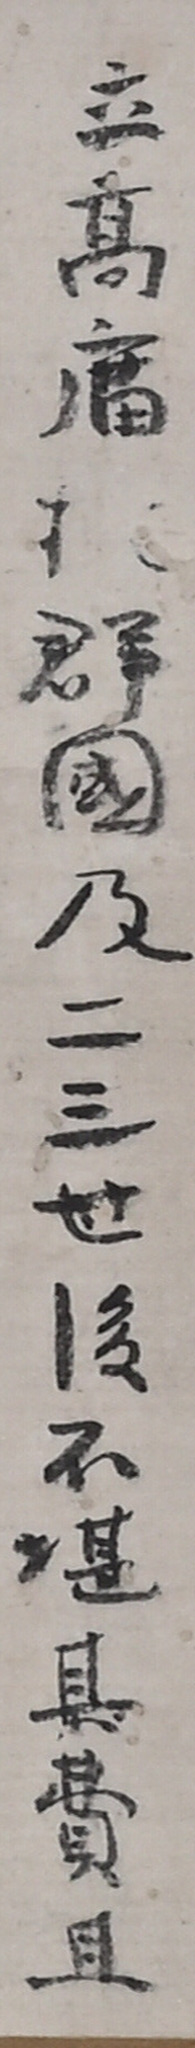立高廟於群国及二三世後不堪其費且
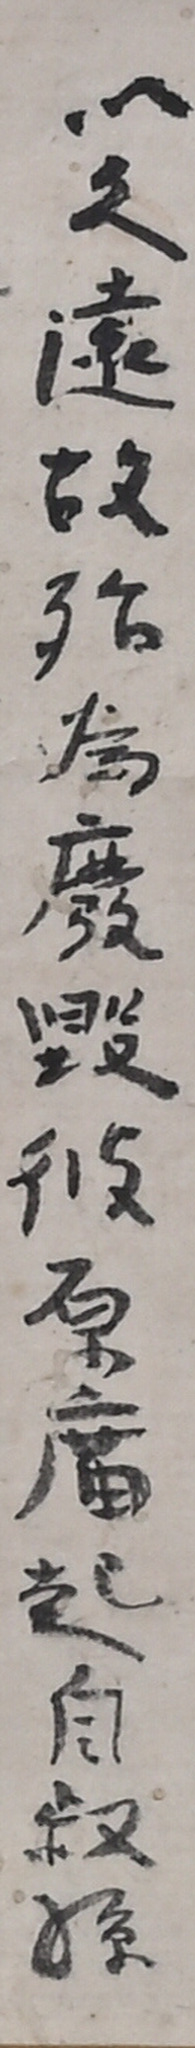以久遠故殆為廃毀彼原廟起自叔孫
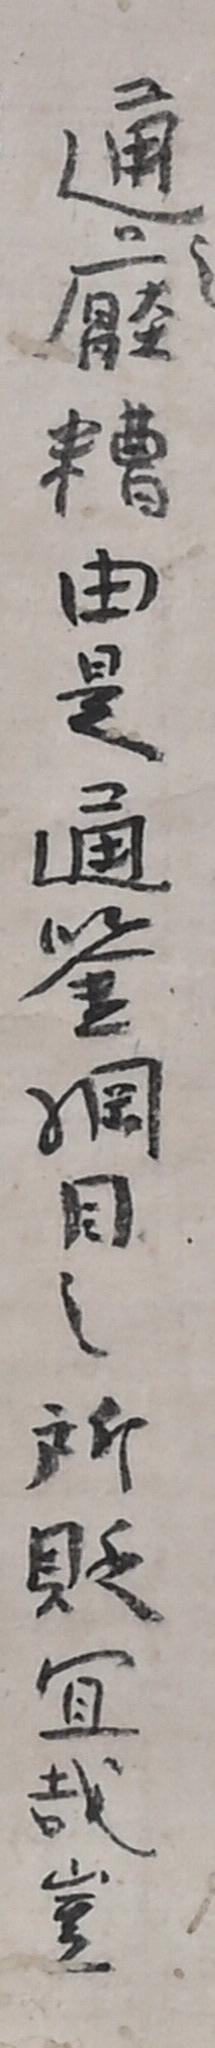通之厭糟由是通鑑綱目之所貶宜哉豈
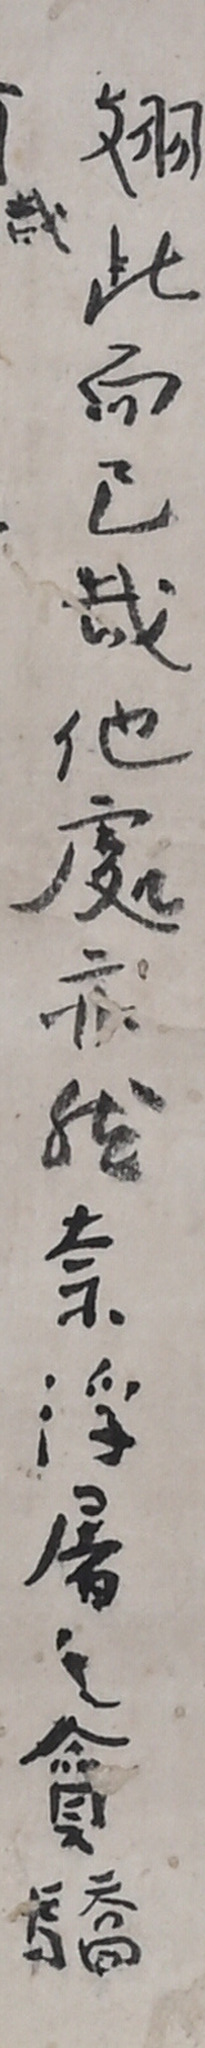翅此而已哉他処亦然奈浮屠之貧驕
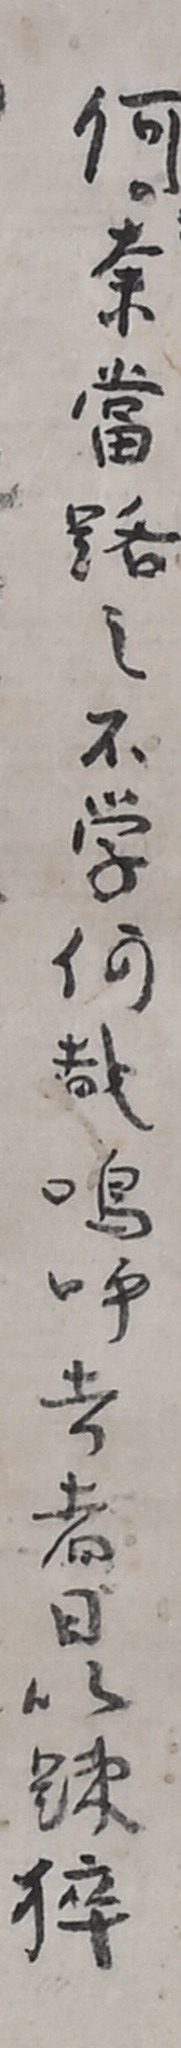何哉奈当路之不学何哉嗚呼去者日以疎猝
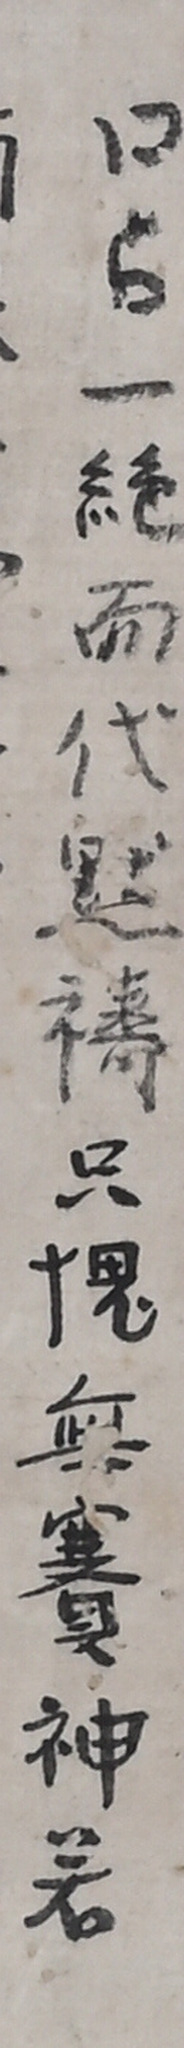口占一絶而代黙祷只愧無賽神若
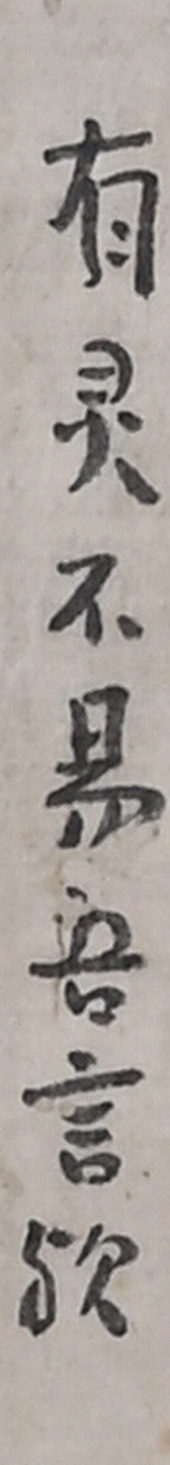有霊不易吾言歟
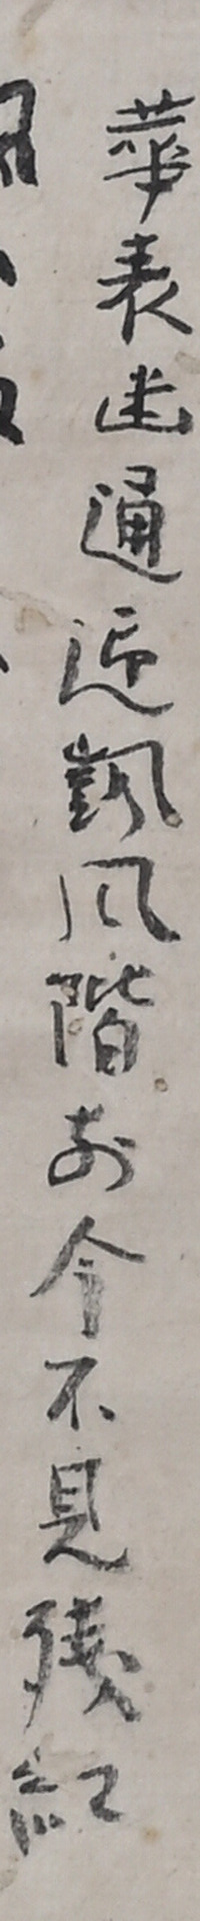華表幽通迎凱風階前今不見残紅
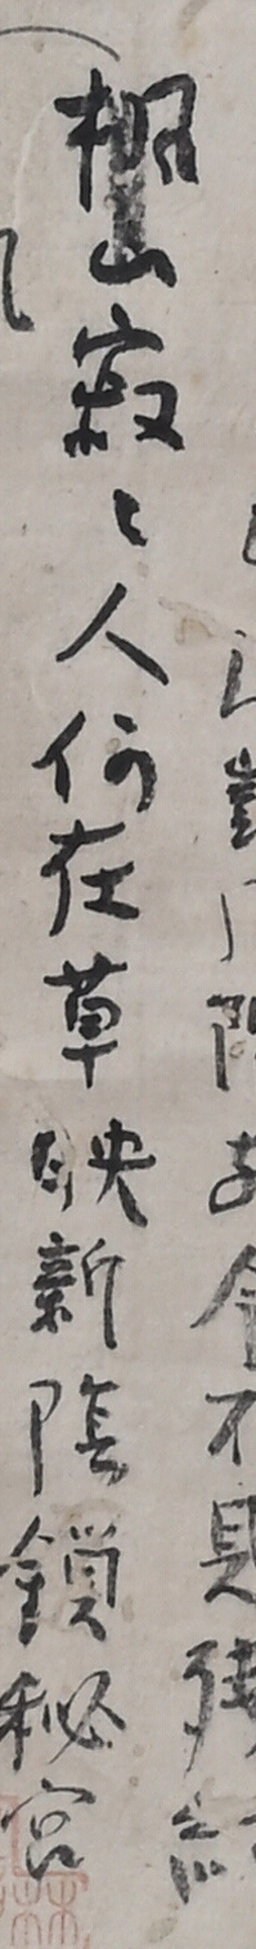楓山寂々人何在草映新陰鎖秘宮

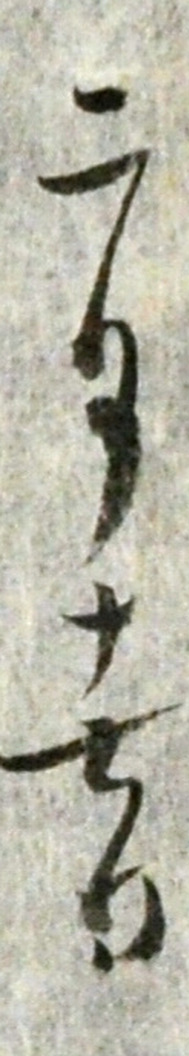二月十七日

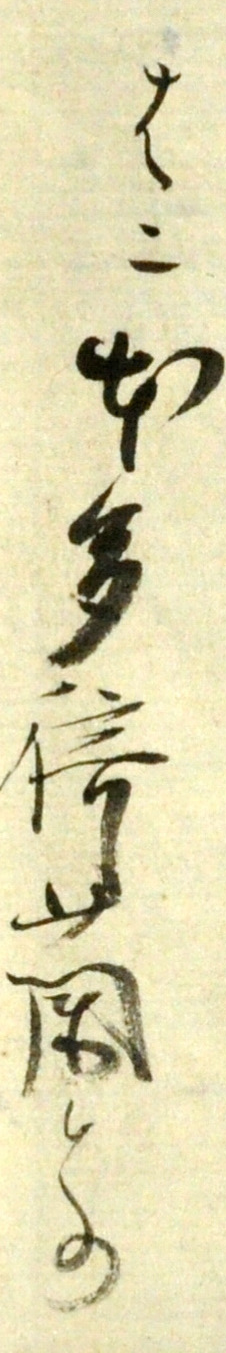はこ本多猗蘭との

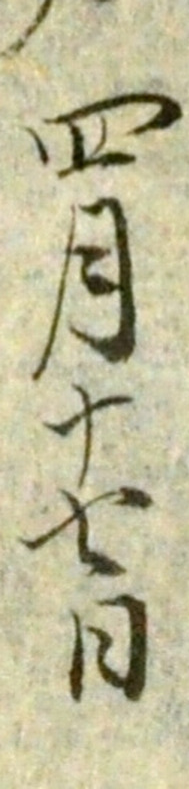四月十七日
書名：掛軸
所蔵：伊那市立高遠町図書館・合同会社AMANE
